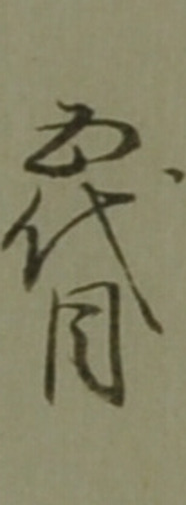五代目
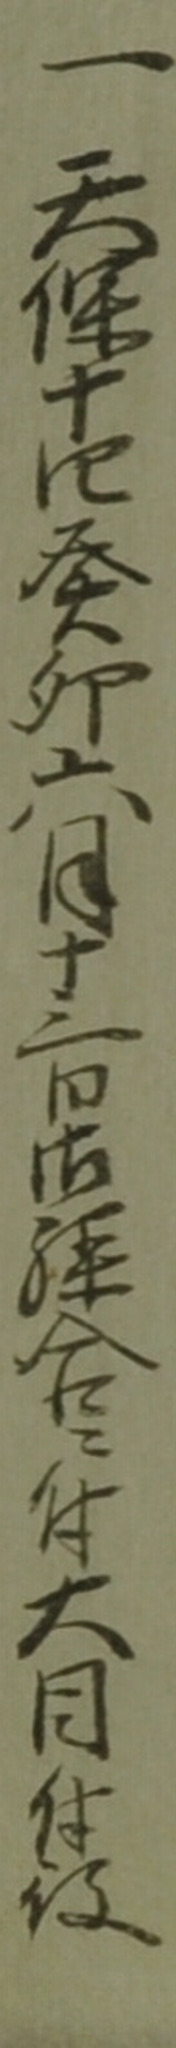一天保十四癸卯六月十三日御繰合ニ付大目付役
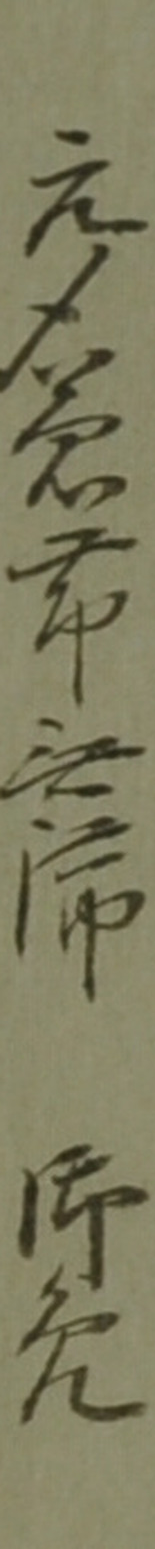元〆兼帯無滞御免
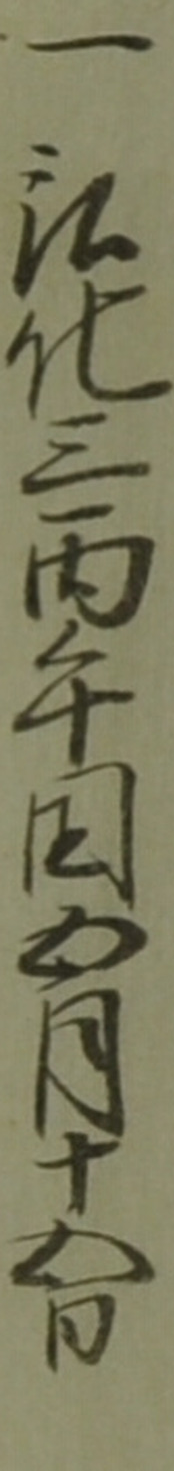一弘化三丙午閏五月十五日
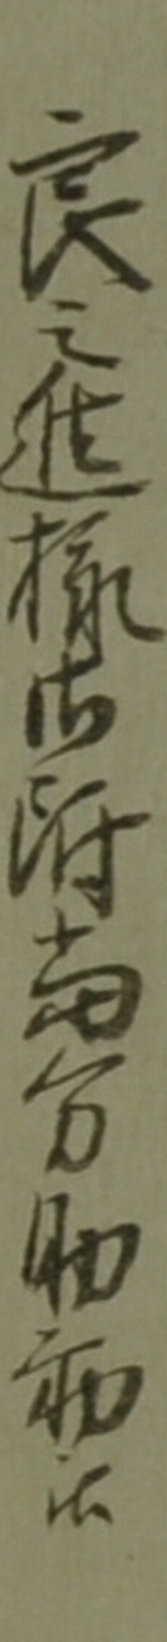良之進様御附当分助勤被
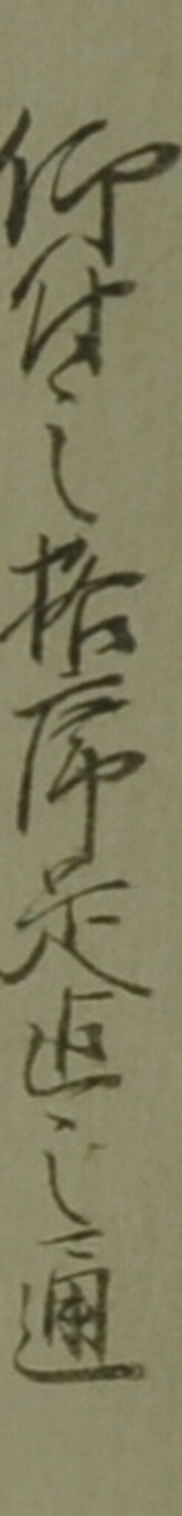仰付之格席是迄之通
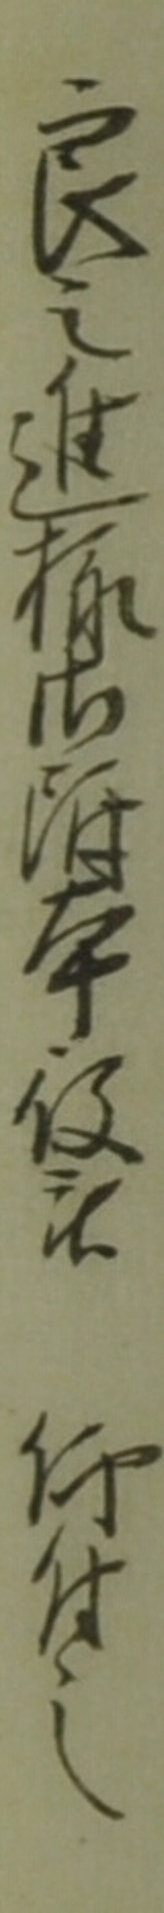良之進様御附本役被仰付之

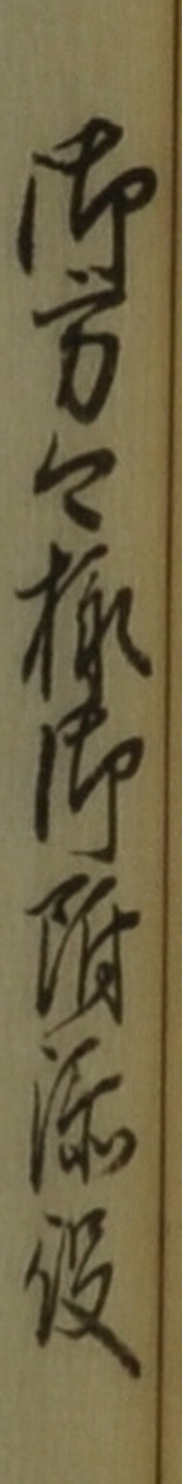御方々様御附添役
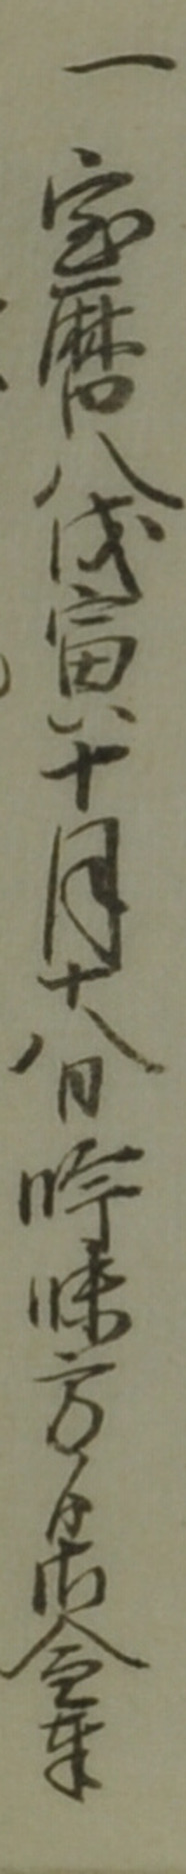一宝暦八戊寅十月十八日吟味方ゟ御金奉
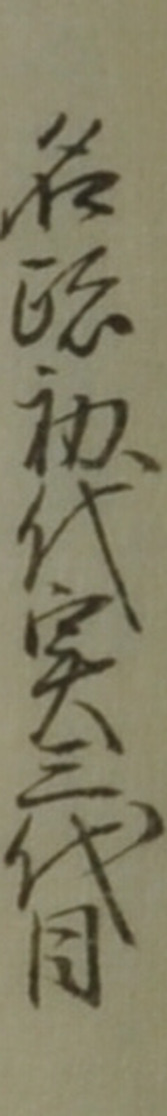名跡初代実三代目
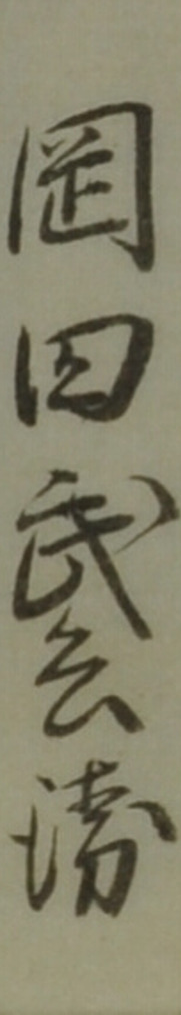岡田武兵衛
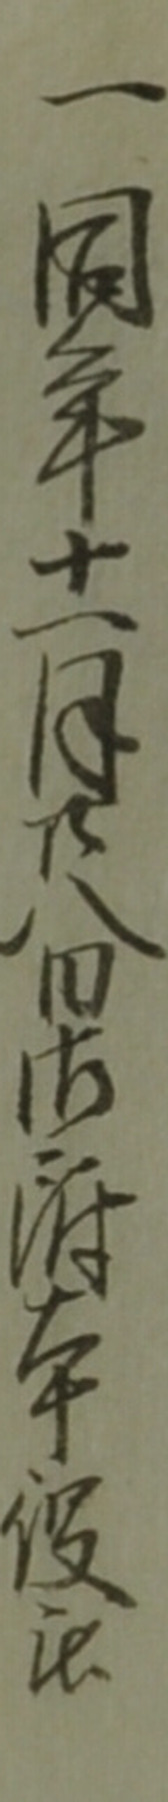一同年十一月廿八日御附本役被
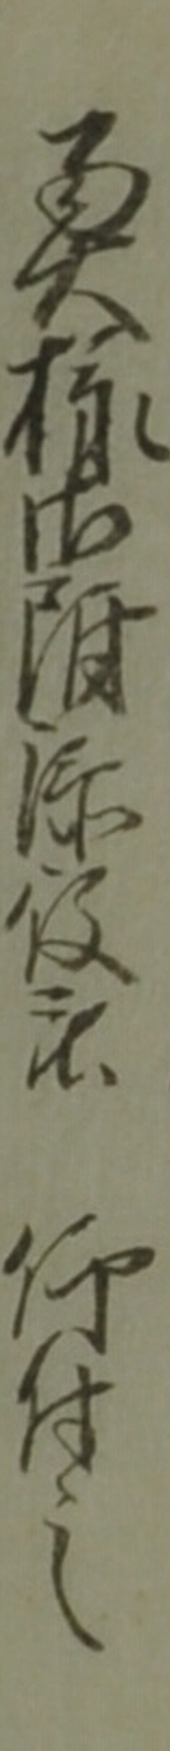奥様御附添役被仰付之
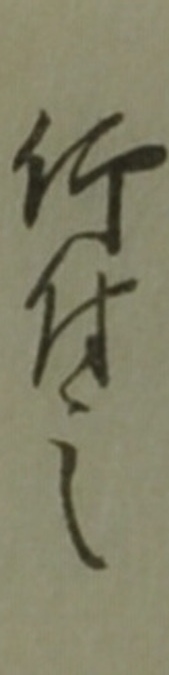仰付之
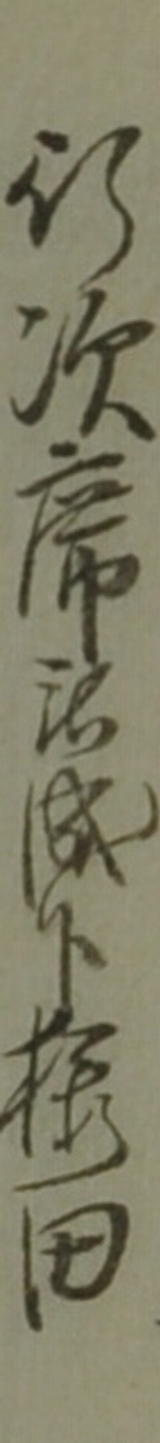行次席被成下様田
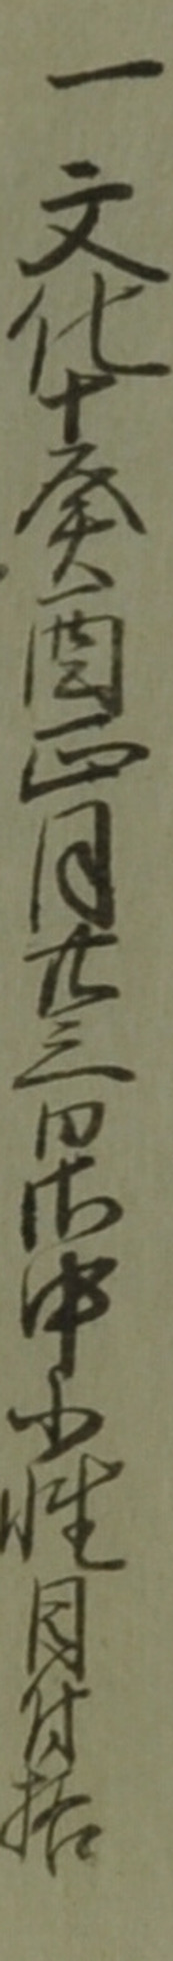一文化十癸酉正月廿三日御中小性目付格
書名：諸御役代々録（六）
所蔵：伊那市立高遠町図書館・合同会社AMANE
